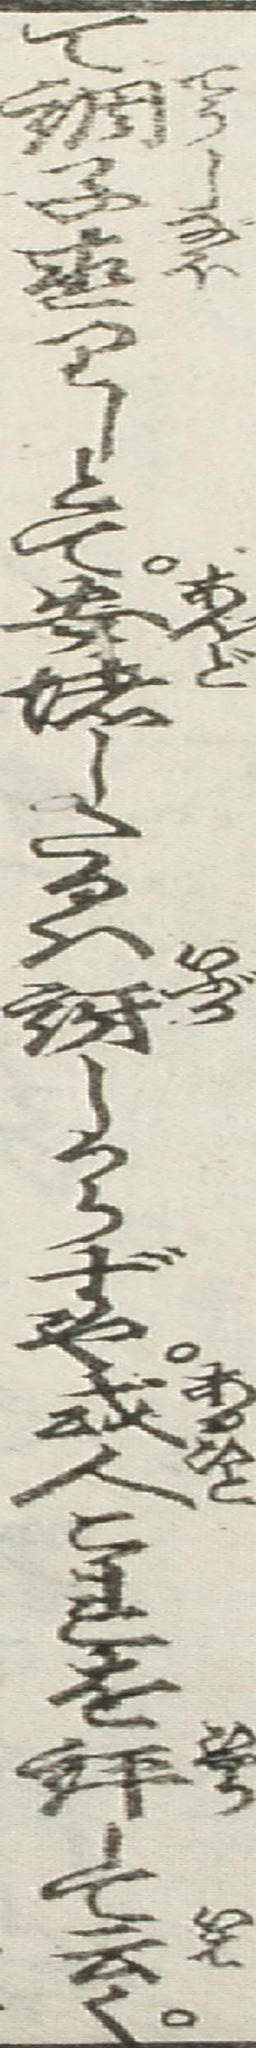て調子直りしとて。安堵したるは訝しからずや。或人これを評して云く。
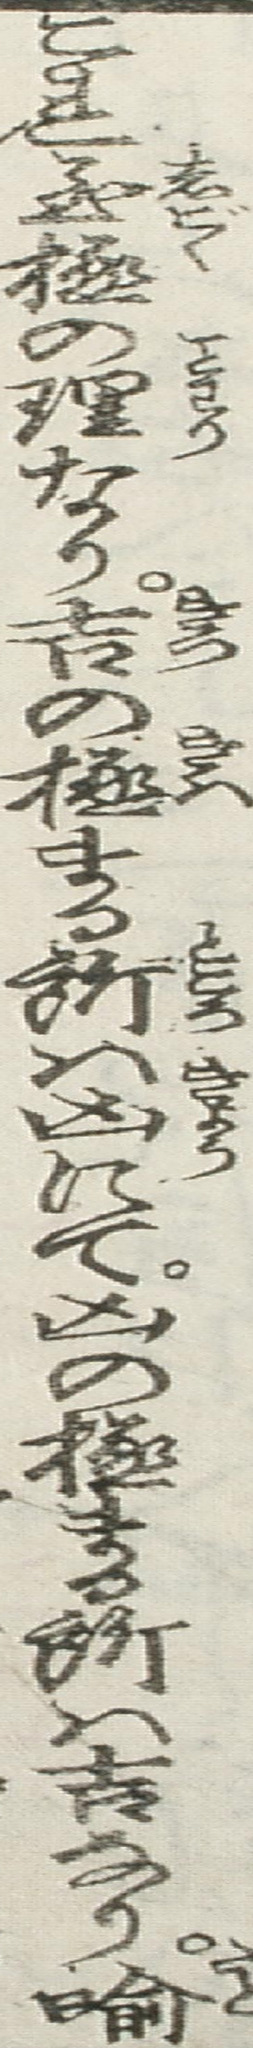これ至極の理なり。吉の極まる所は凶にて。凶の極まる所は吉なり。喩
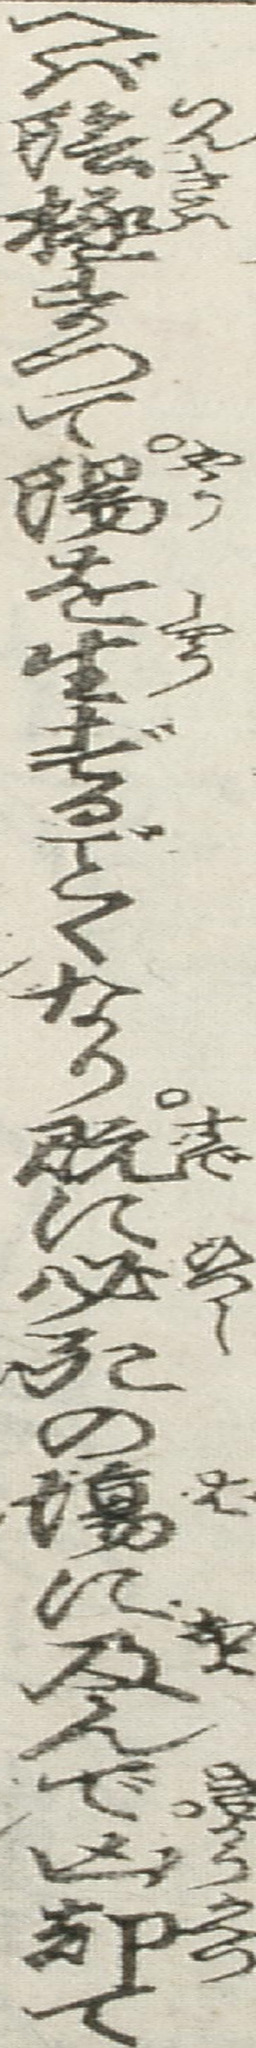へば陰極まつて陽を生ずるごとくなり。既に必死の場に及んで。凶却て
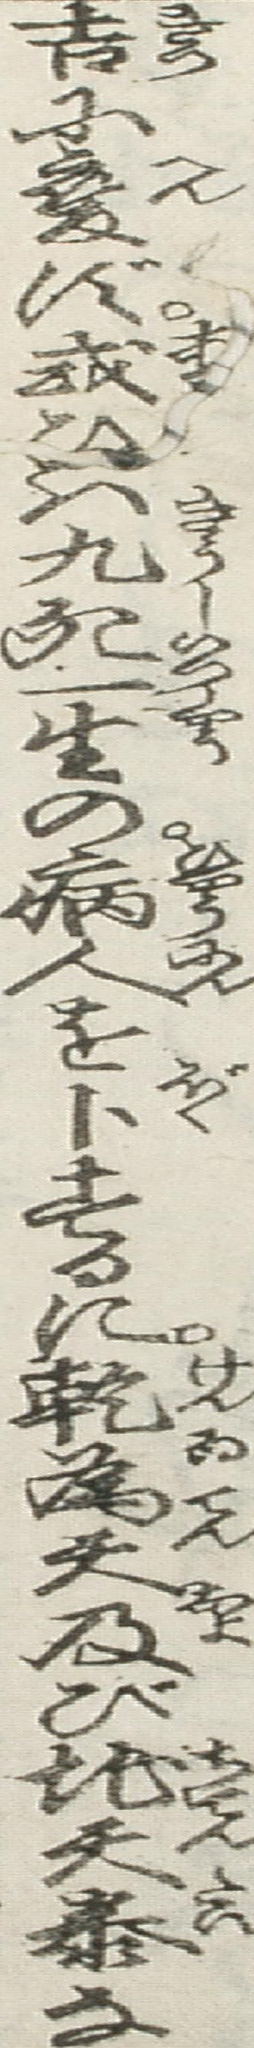吉に変ず。或ひは九死一生の病人を卜するに。乾為天及び地天泰な
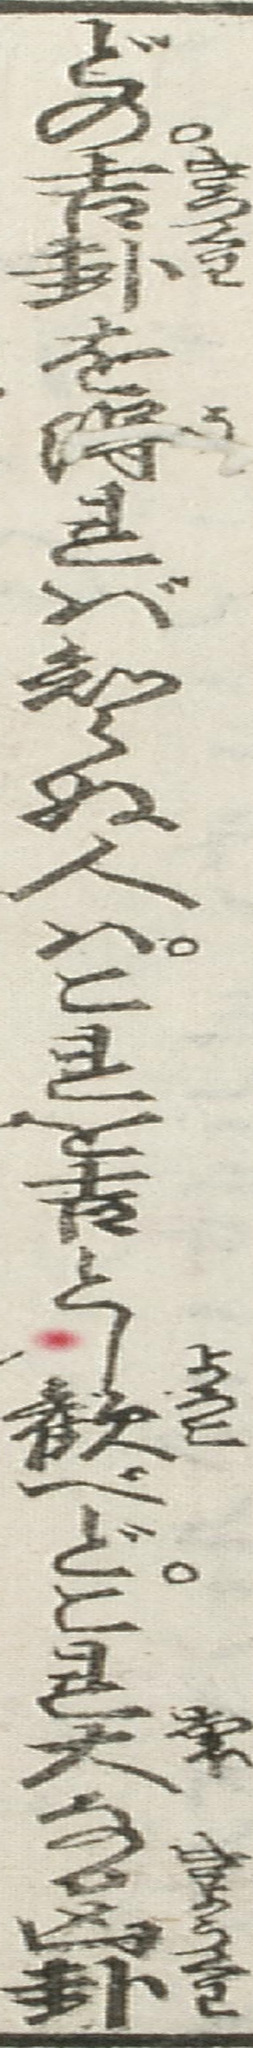どの。吉卦を得れば知らぬ人は。これを吉とし歓べど。これ大なる凶卦
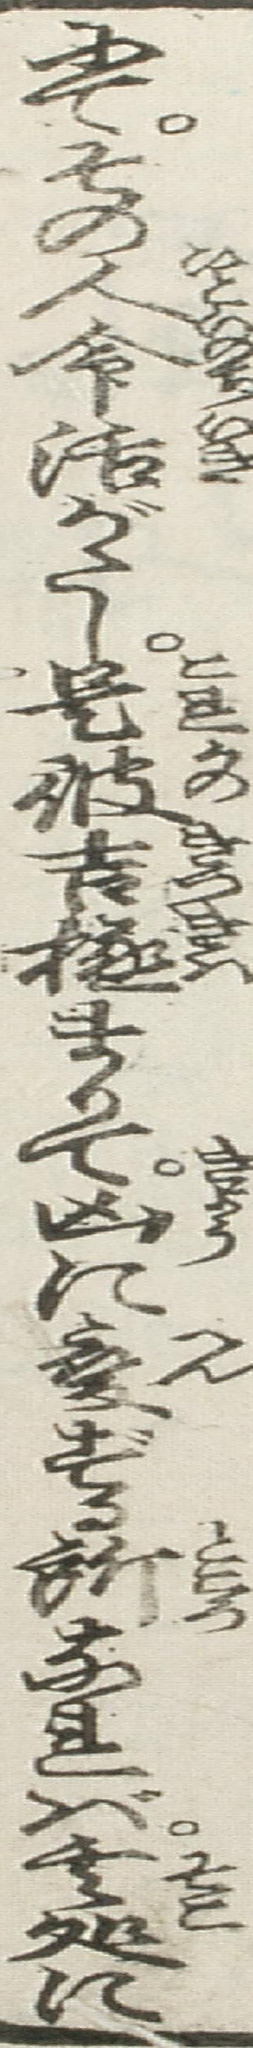にて。その人命活がたし。是彼吉極まりて。凶に変ずる所なれば。其処に
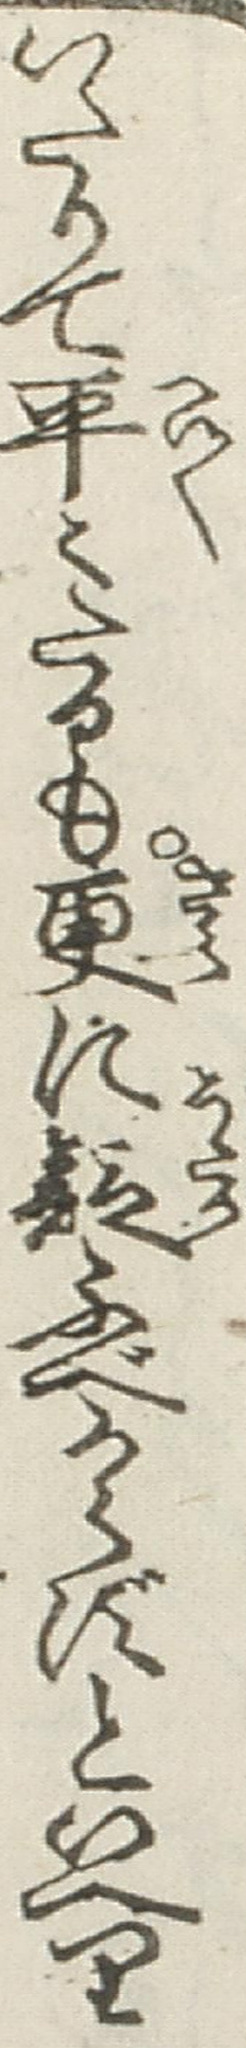いたりて平々たるも。更に疑ふべからずといへり
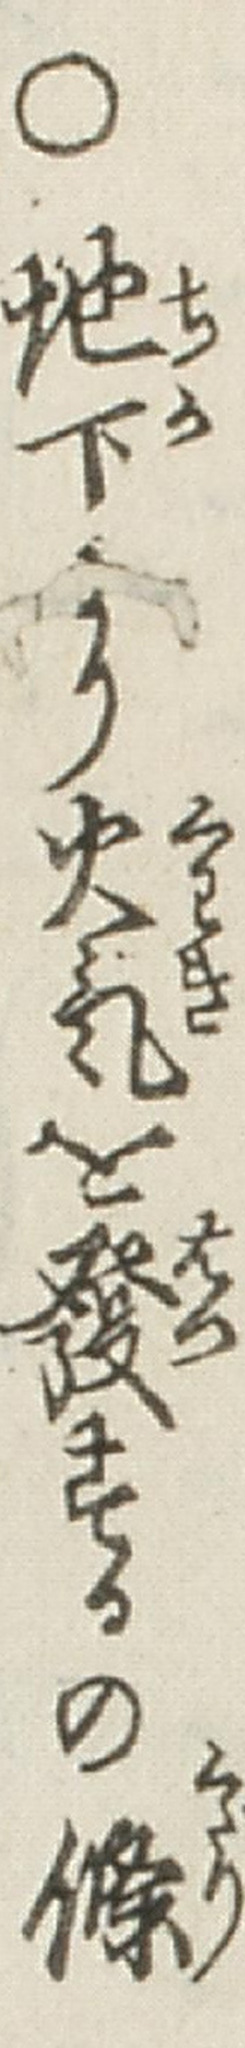◯地下より火気を発するの條
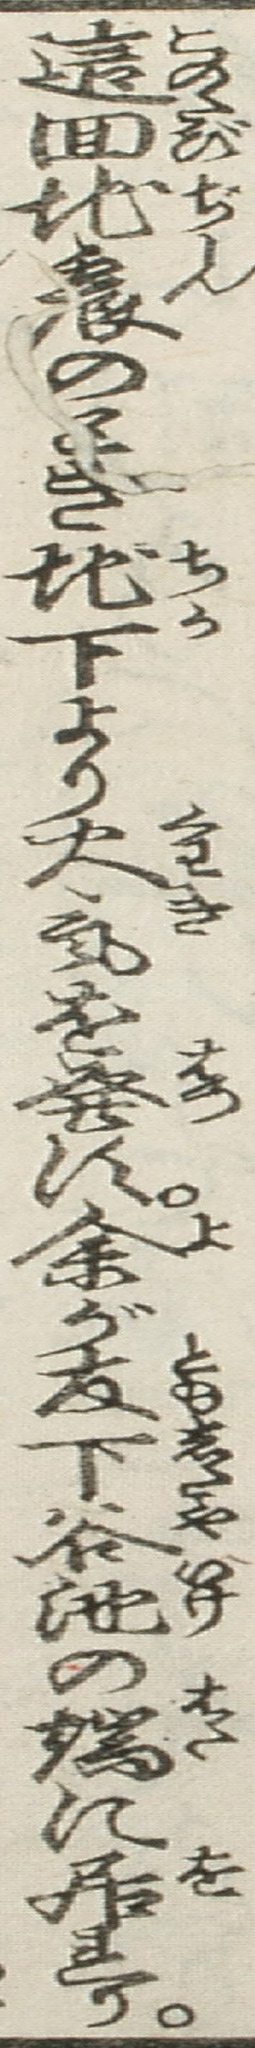這回地震のとき地下より火気を発す。余が友下谷池の端に居れり。
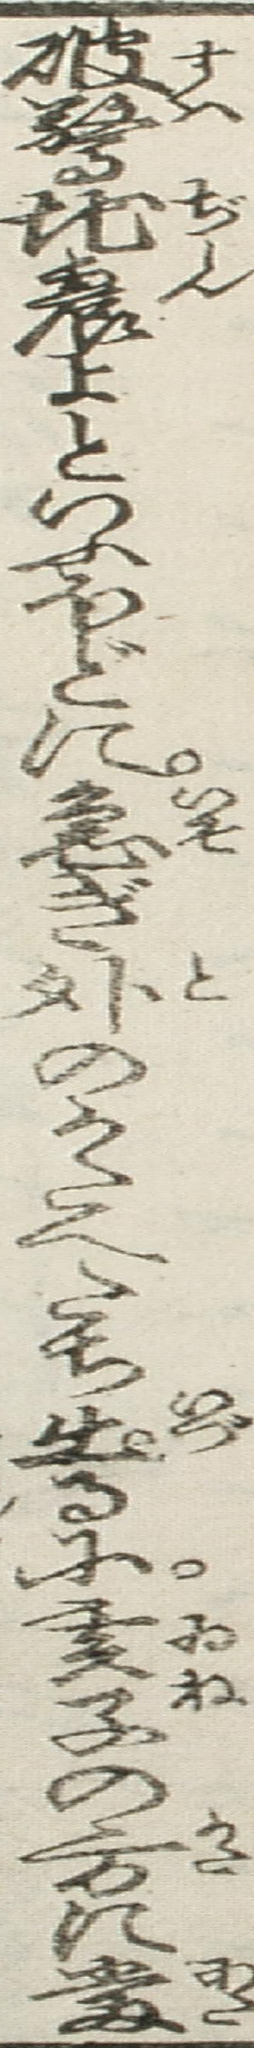破驚地震よといふほどに。急ぎ外のかたへたち出るに。亥子の方に当
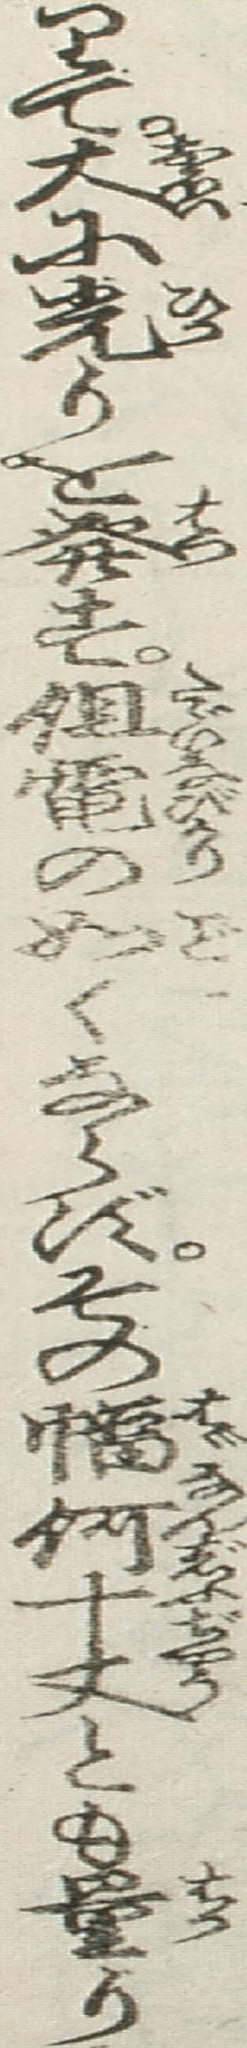りて。大に光りを発す。但電の如くならず。その幅何十丈とも量り
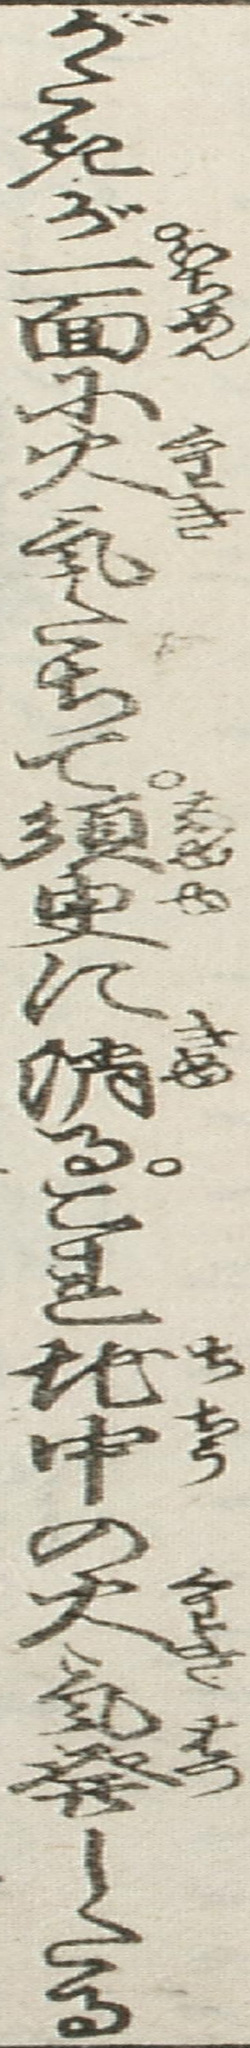がたきが。一面に火気たちて。須臾に消る。これ地中の火気発したる
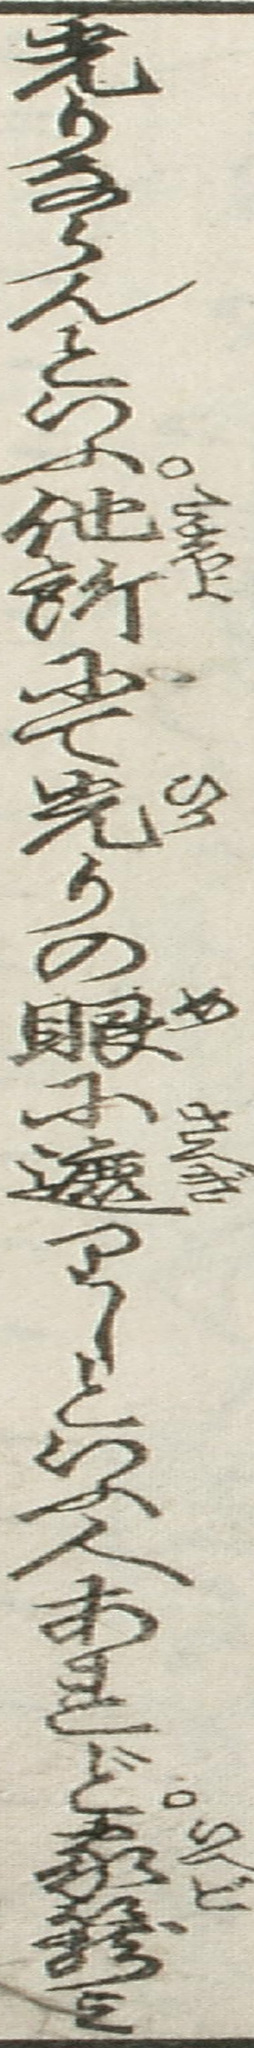光りならんといふ。他所にて光りの眼に遮りしといふ人あれど。家籠み
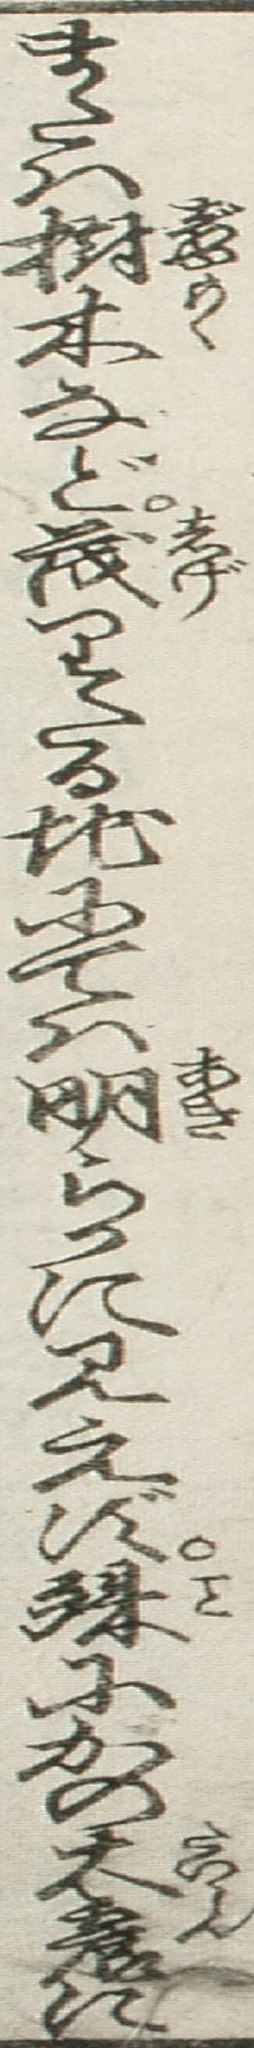または樹木など。茂りたる地にては明らかに見えず。殊にかの大震に
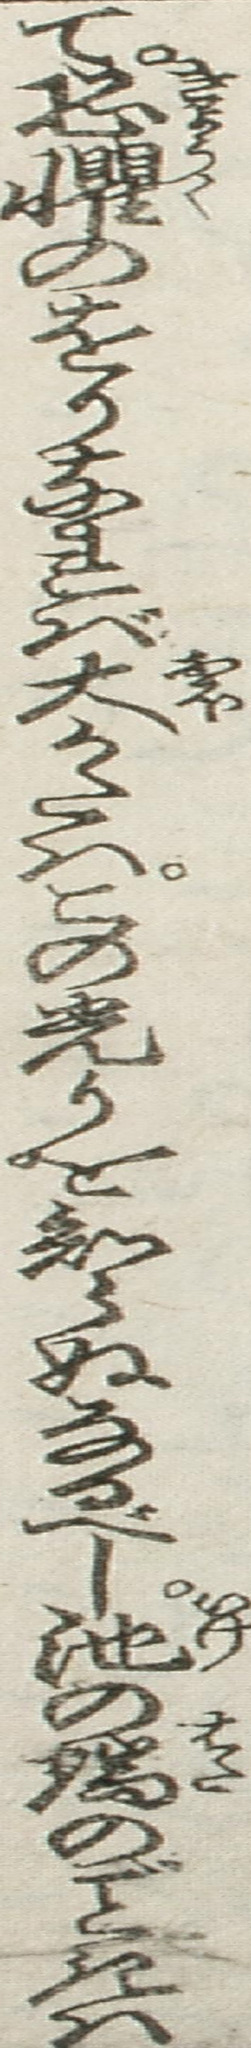て。恐懼のをりなれば。大かたは。この光りを知らぬなるべし。池の端のごときは
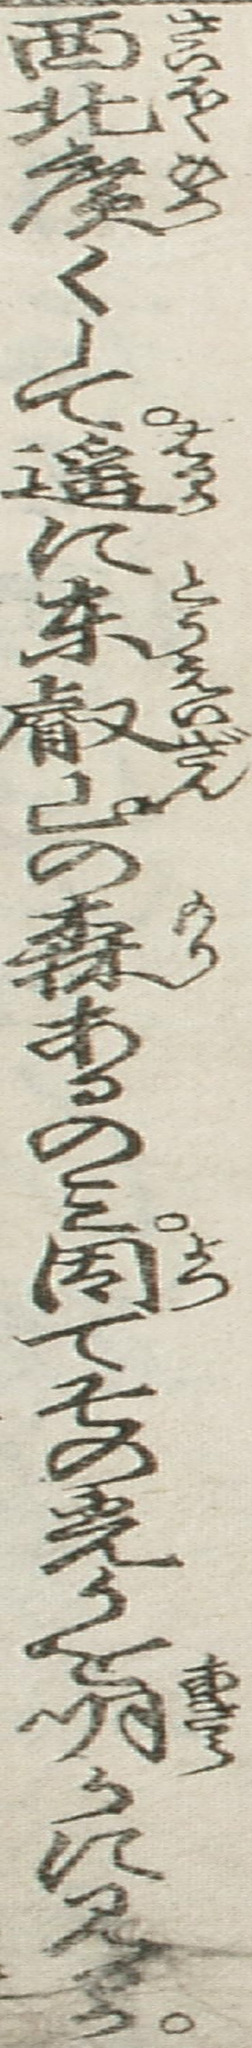西北広くして。遥に東叡山の森あるのみ。因てその光りを明かに見るか。
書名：安政見聞録　下
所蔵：東京大学地震研究所図書室 Earthquake Research Institute Library, The University of Tokyo, JAPAN
